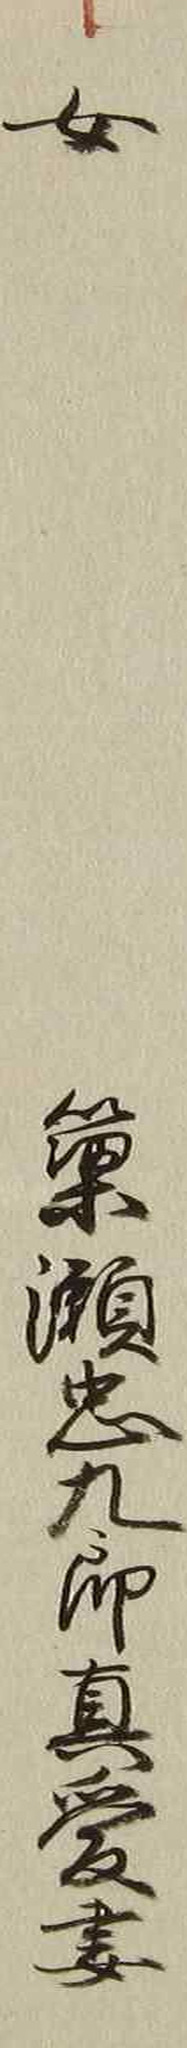女簗瀬忠九郎真愛妻
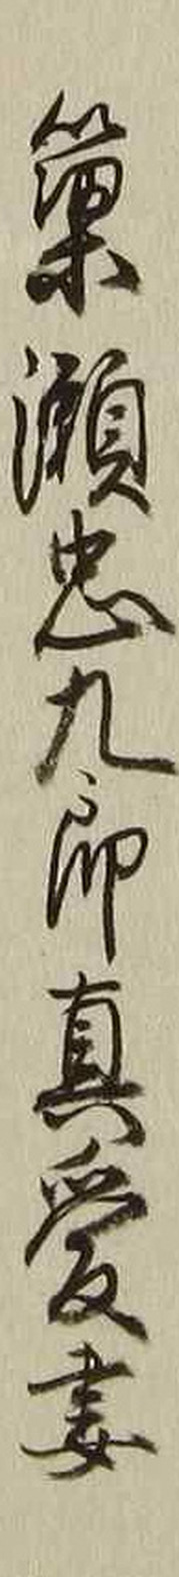女簗瀬忠九郎真愛妻
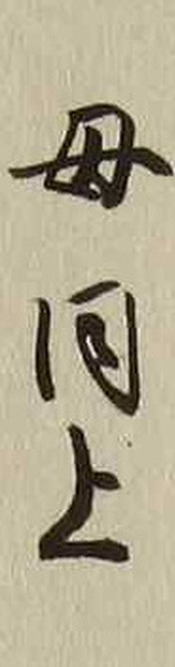母同上
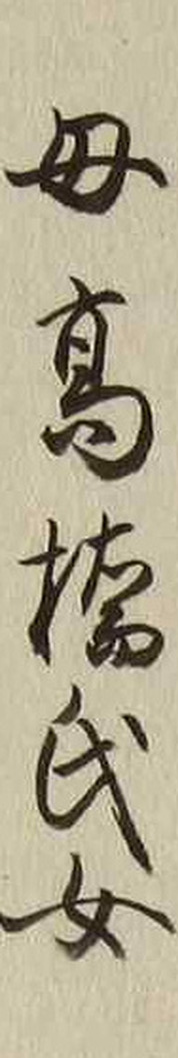母高橋氏女
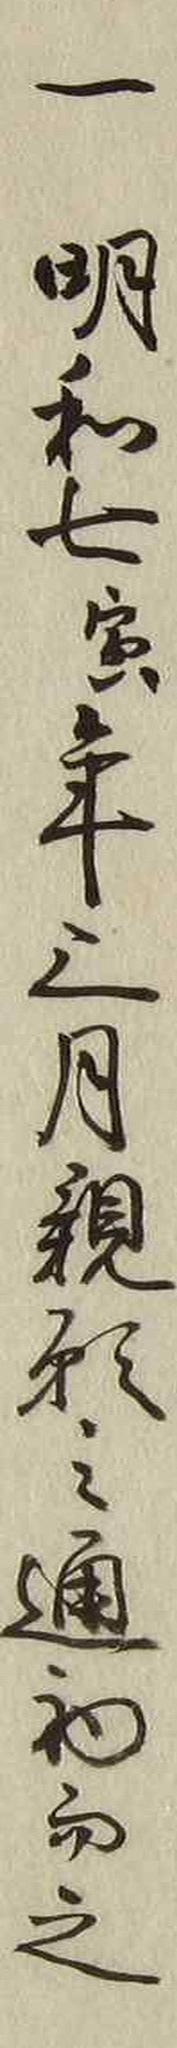一明和七寅年三月親願之通初而之
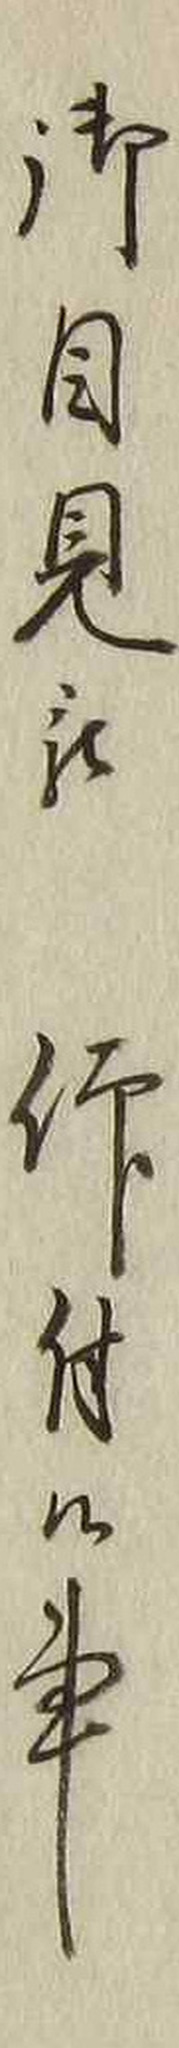御目見被仰付候事
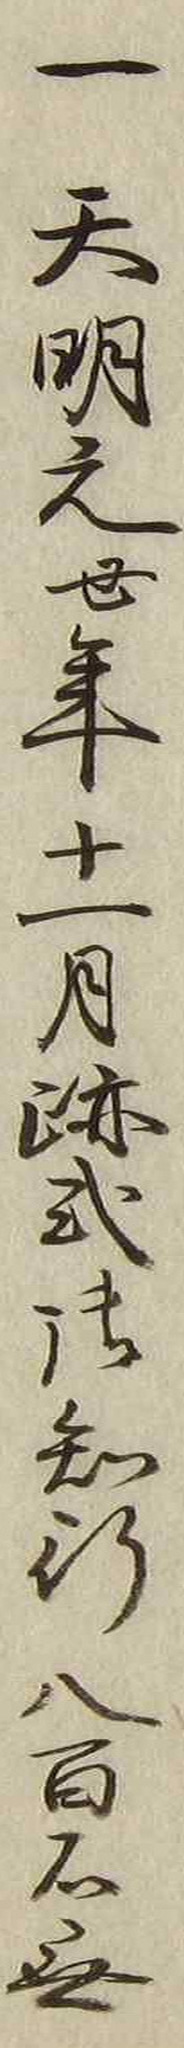一天明元丑年十一月跡式御知行八百石無
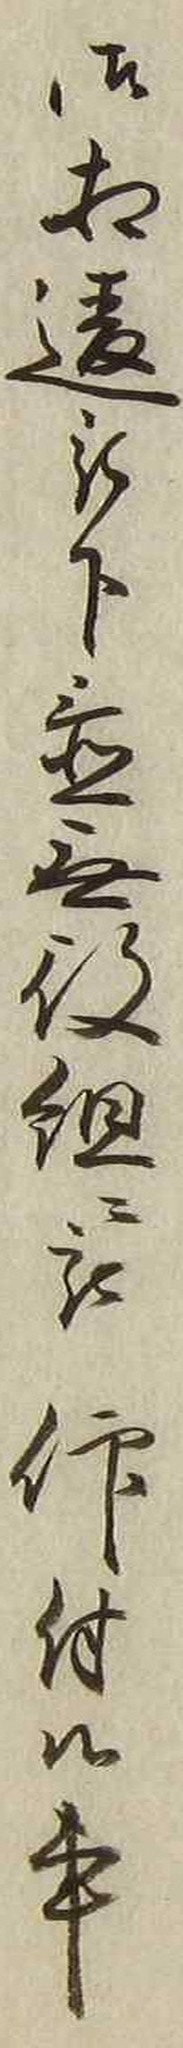御相違被下置無役組ニ被仰付候事
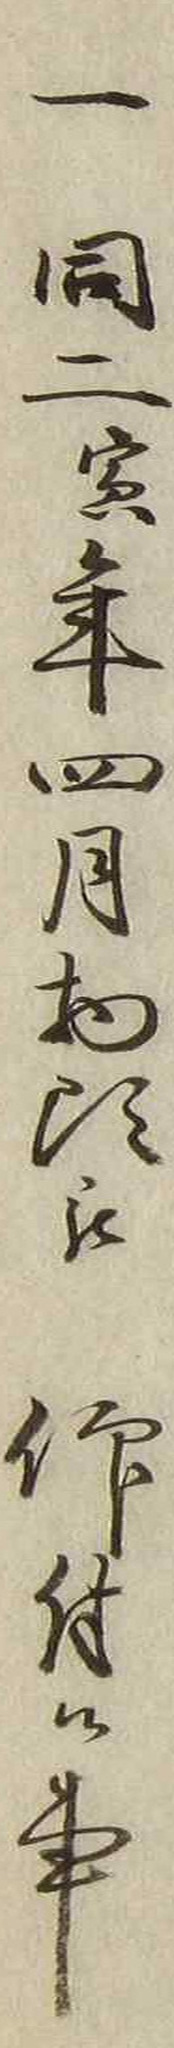一同二寅年四月物頭被仰付候事
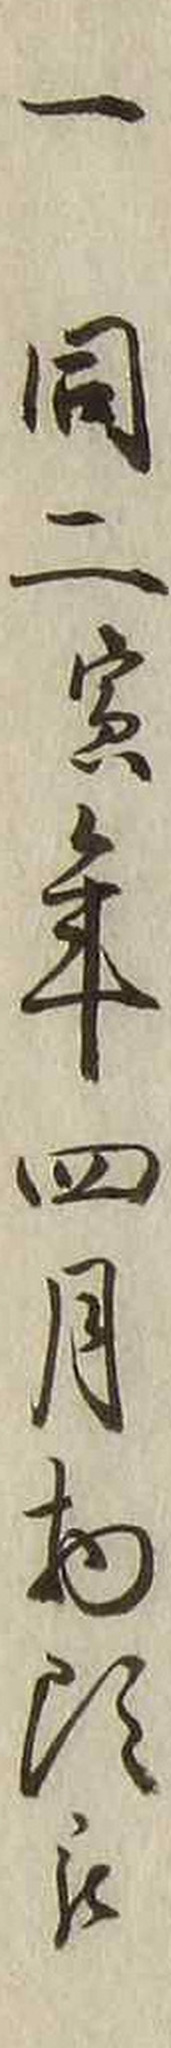一同二寅年四月物頭被仰付候事

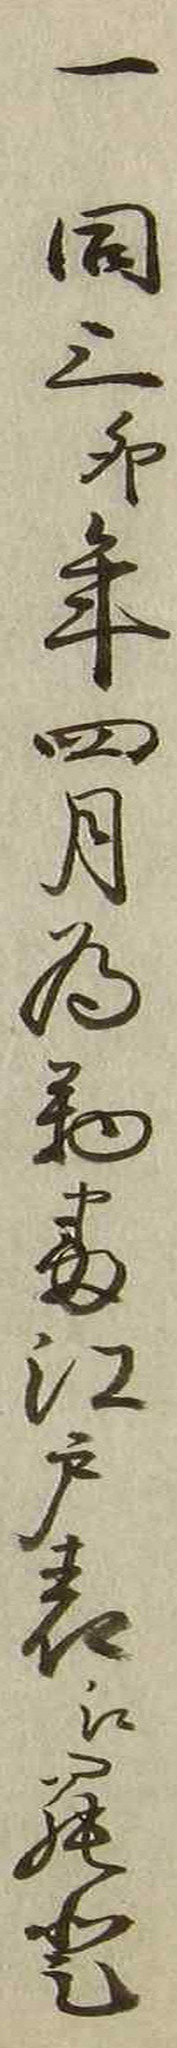一同三卯年四月為勤番江戸表江罷登
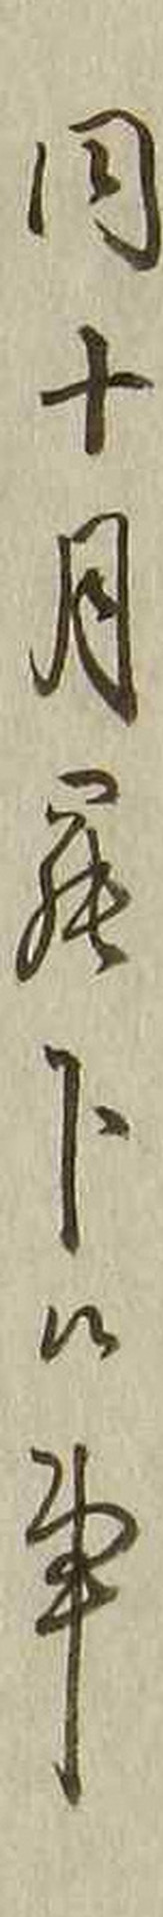同十月罷下候事
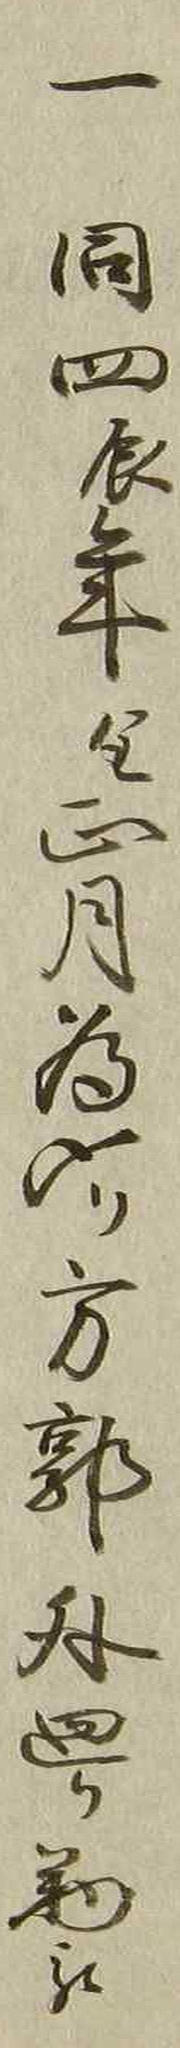一同四辰年閏正月為〆り方郭外廻り勤被
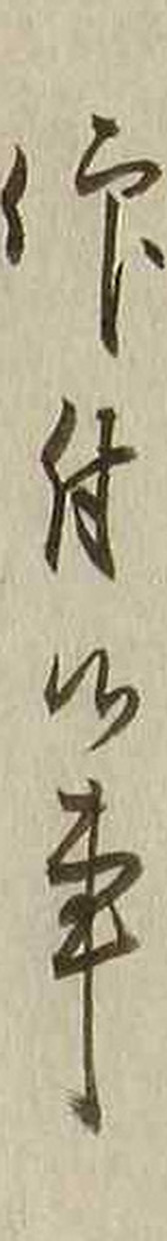仰付候事
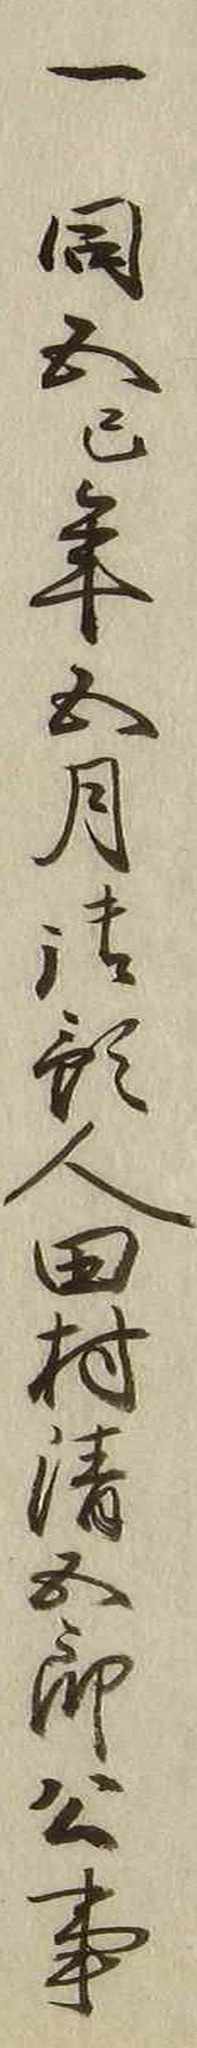一同五巳年五月御預人田村清五郎公事
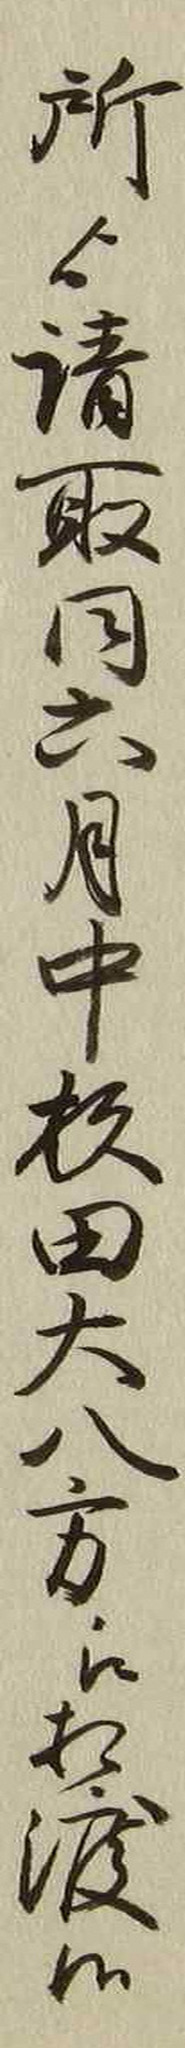所ゟ請取同六月中杉田大八方江相渡候
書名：諸士系譜　巻之15　い之部15
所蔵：会津若松市立会津図書館
